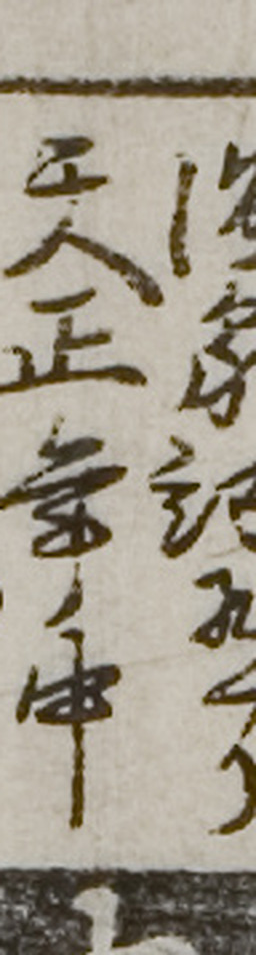天正年中
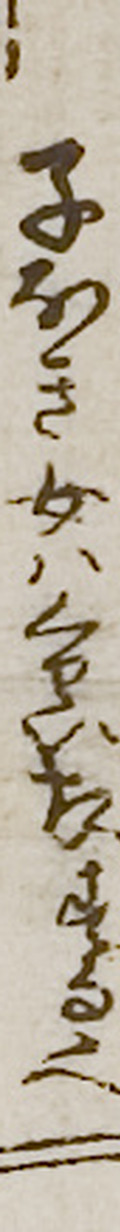子なき女はくわいにんする也
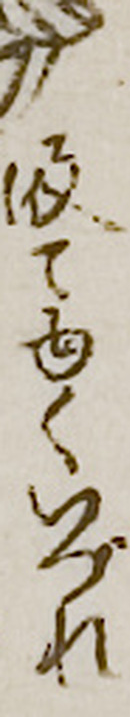汲てゆくいづれ
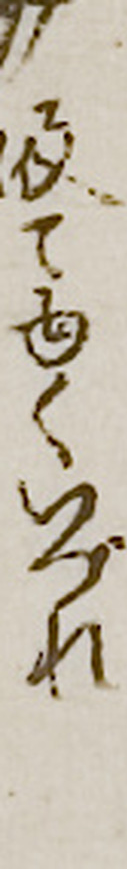汲てゆくいづれ
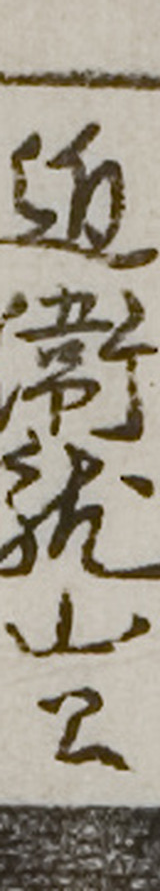近衛龍山公
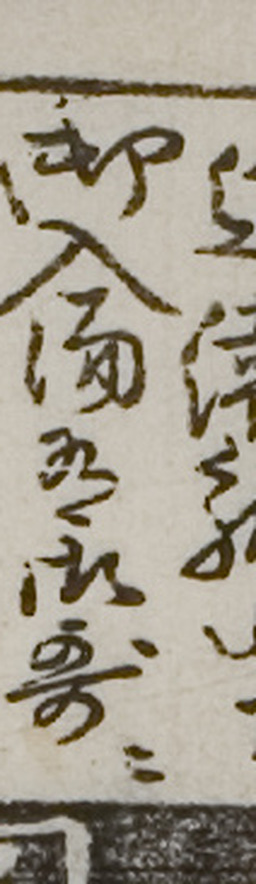御入湯有御歌に
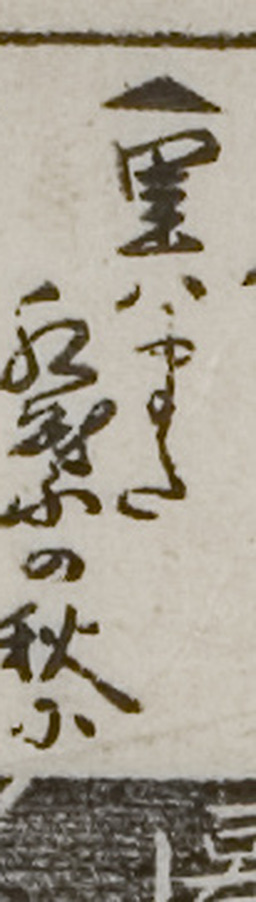紅葉の秋に
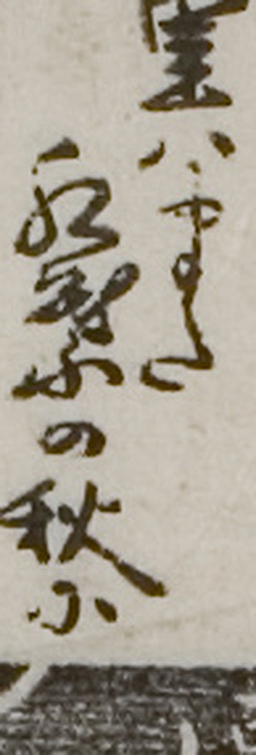紅葉の秋に
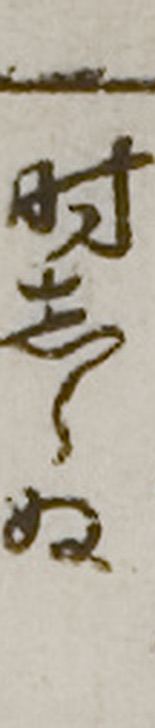時しらぬ
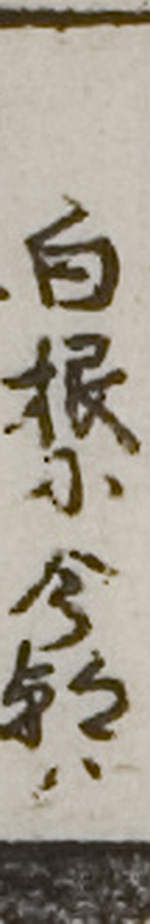白根に今朝は
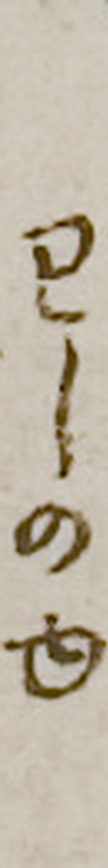わしのゆ
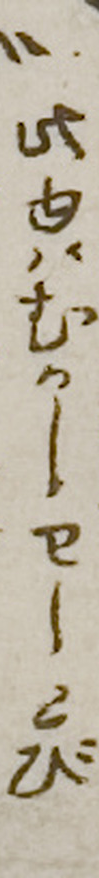此ゆはむかしわしとび
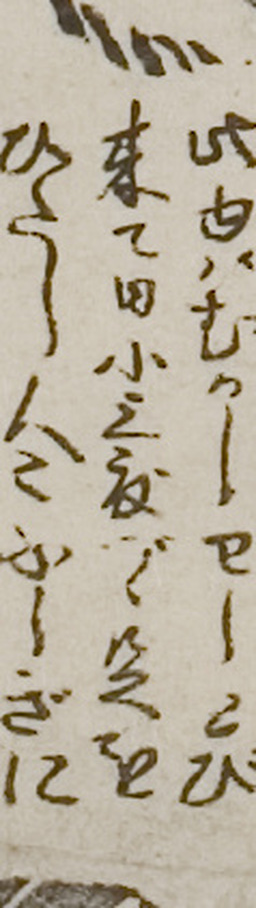来て日に三度づゝ足を
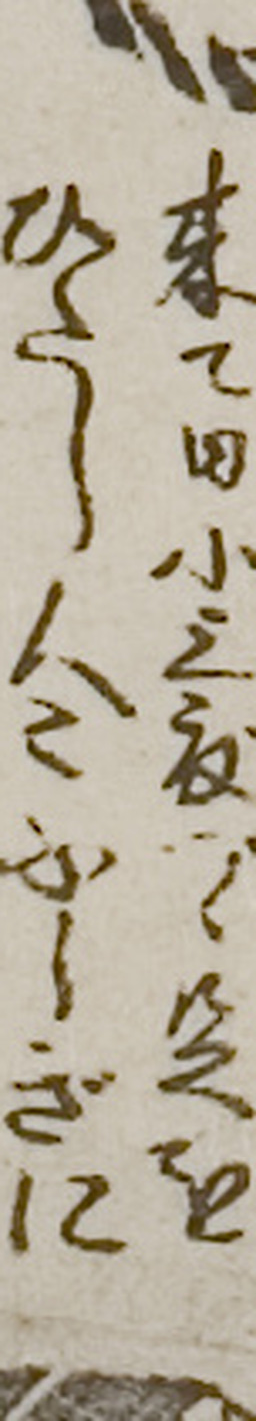ひたし人〻ふしぎに
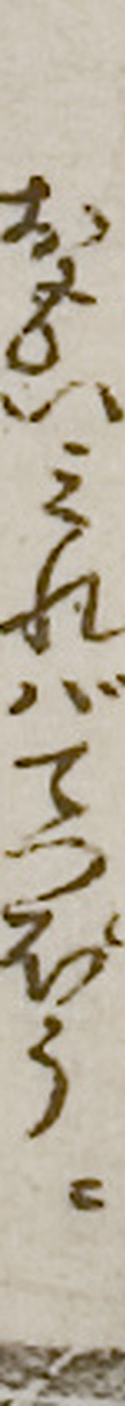おもいみればてつぽうに
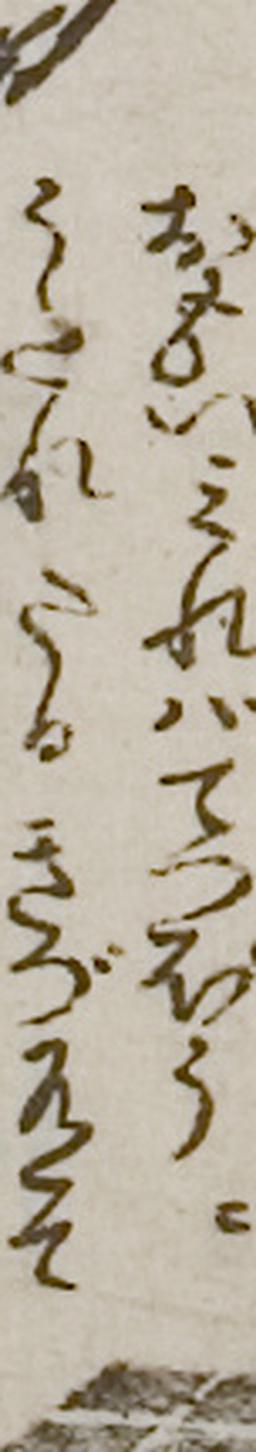うたれたるきづ有て
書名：上州草津温泉大図
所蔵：東京大学総合図書館 General Library in the University of Tokyo, JAPAN
